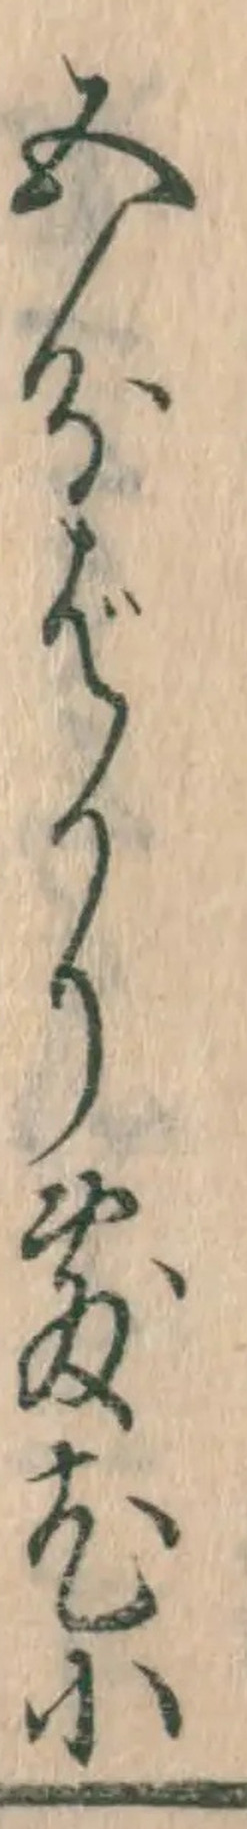五分ばかり敷尤に
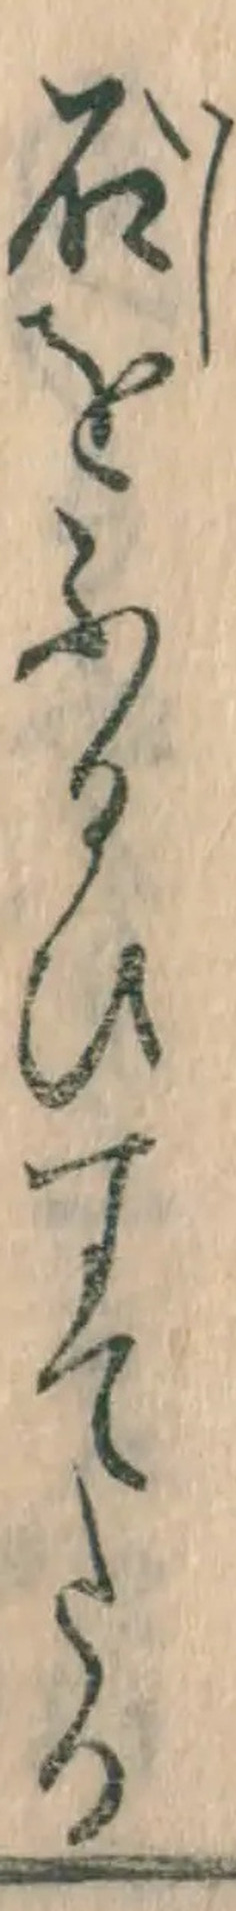石をふるひすてたる
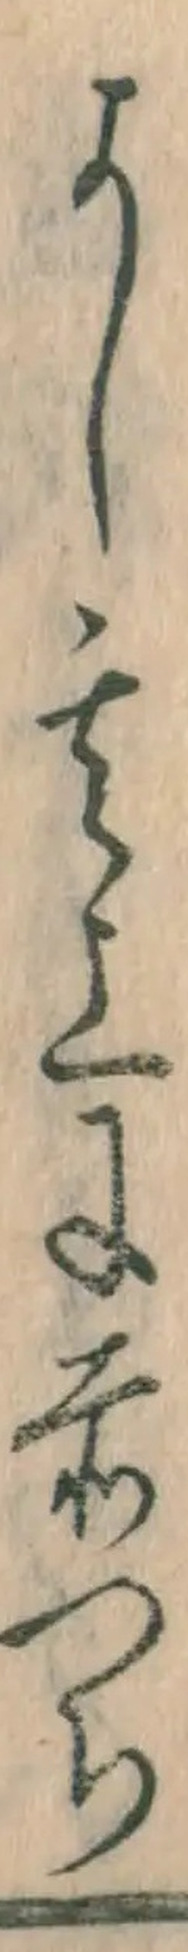よし其上に赤つち

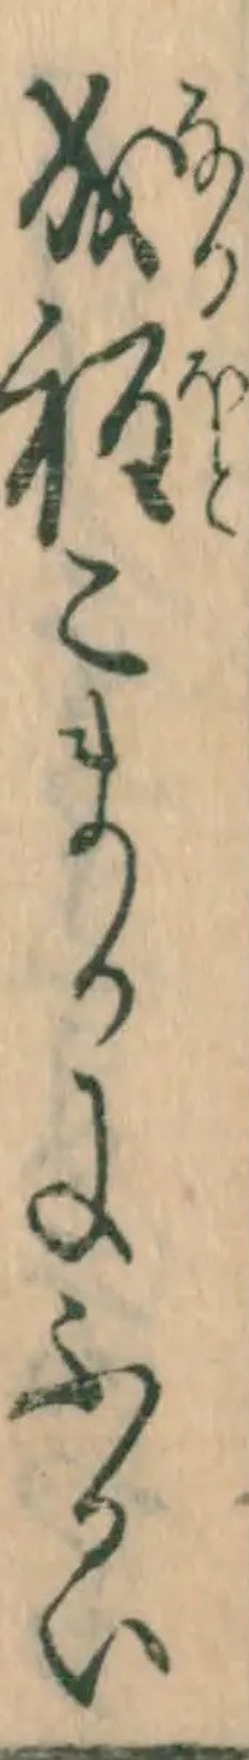成程こまかにふるい
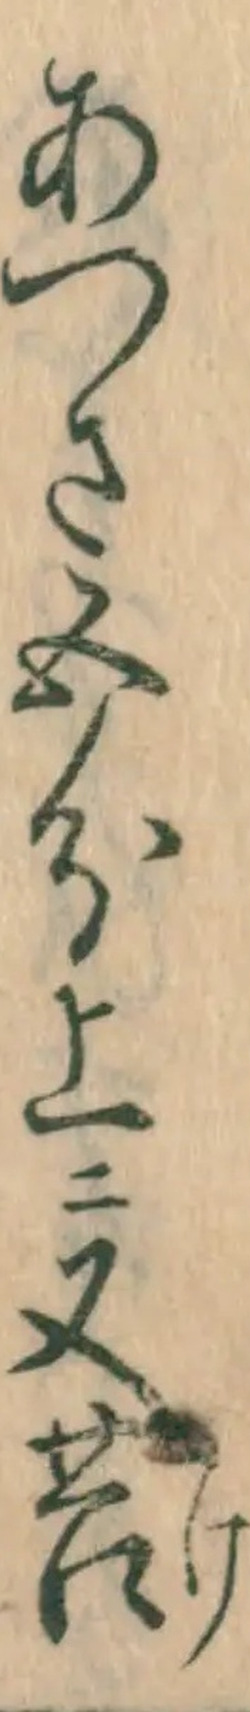あつさ五分上又苔
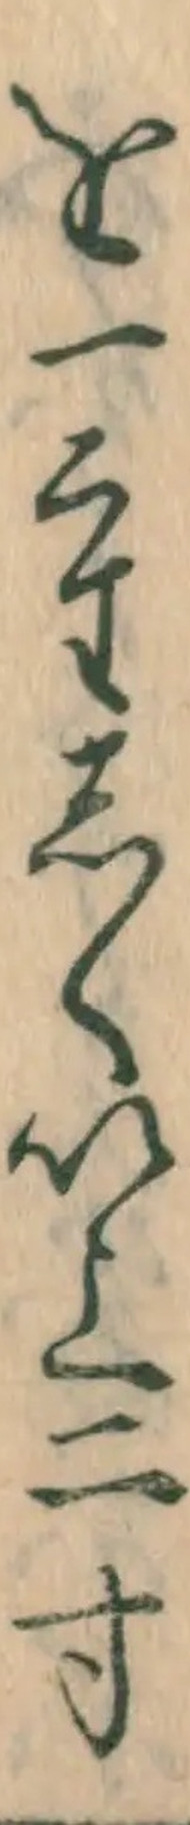を一重しく以上二寸
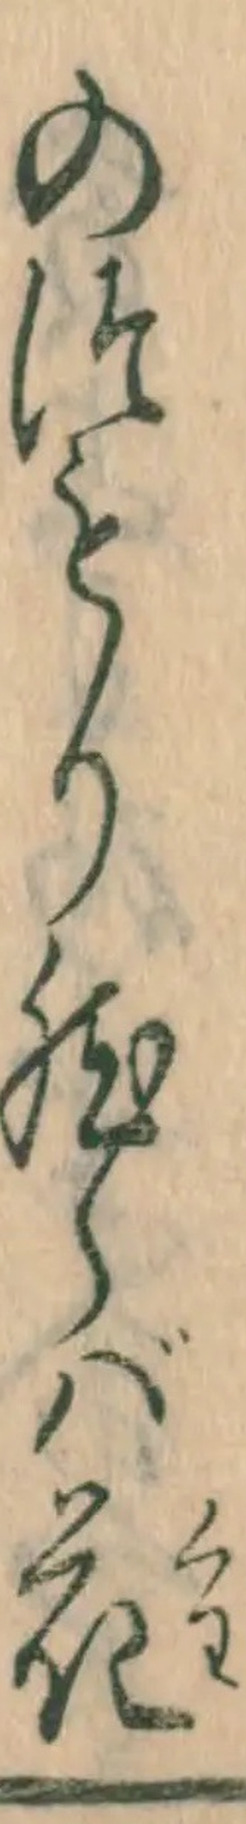のつもり然らば花
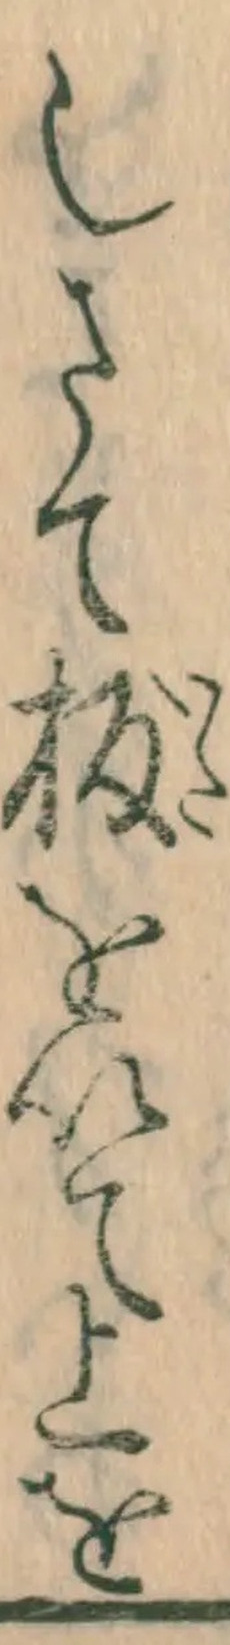也さて板を以て上を
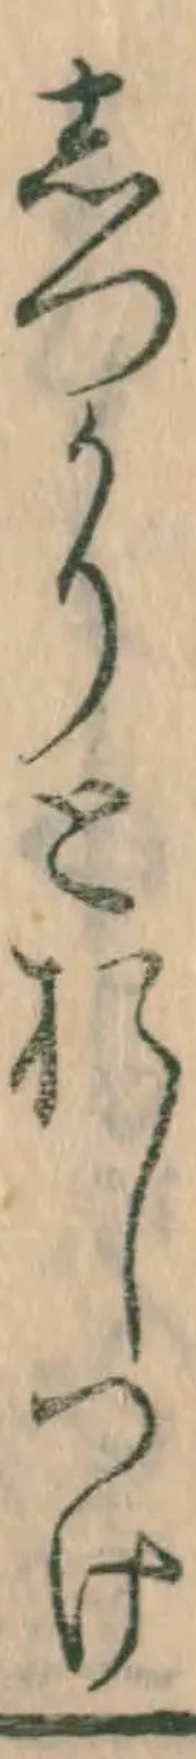しつかりとおしつけ
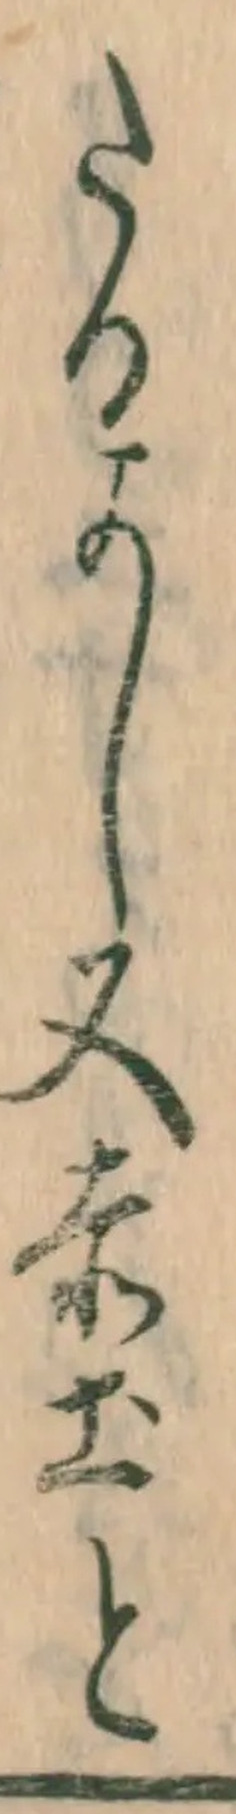たるよし又赤土と
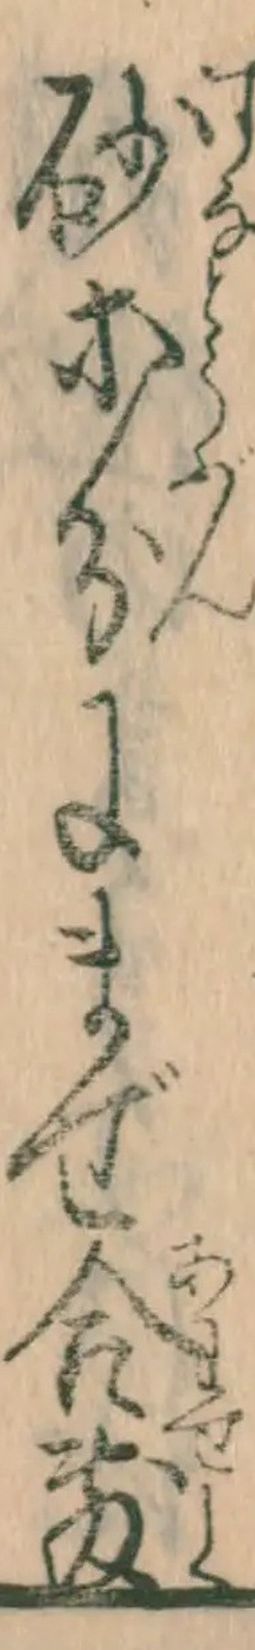砂等分にまぜ合敷
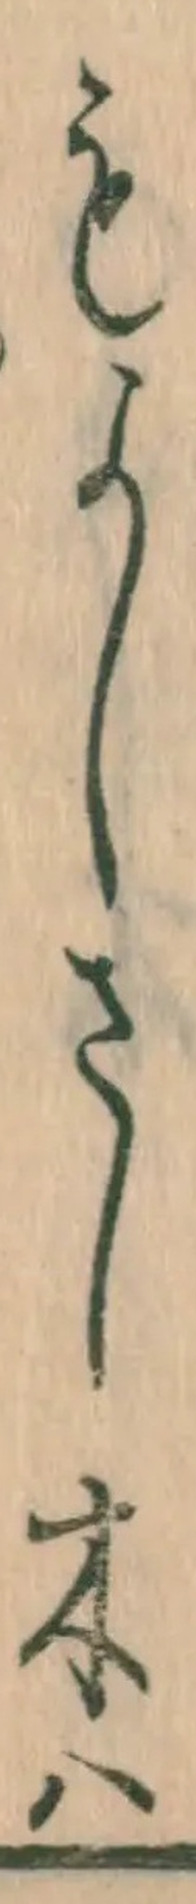もよしさし木は
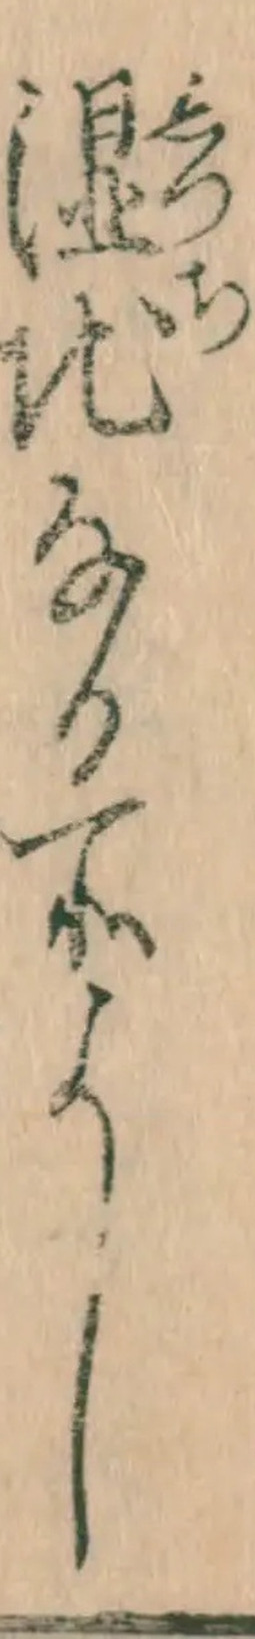湿地なる所よし
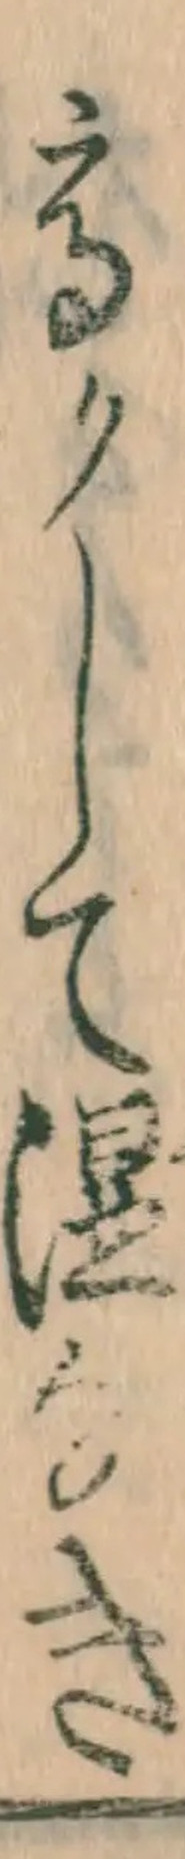高くして湿なき
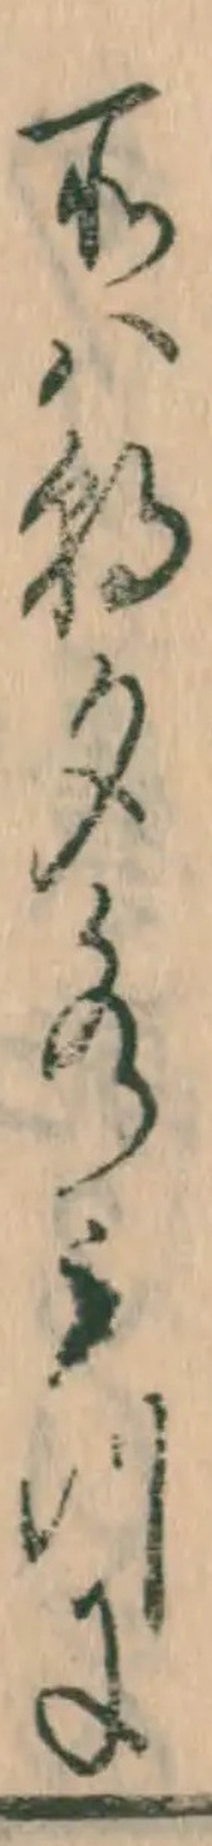所は朝夕水うつに
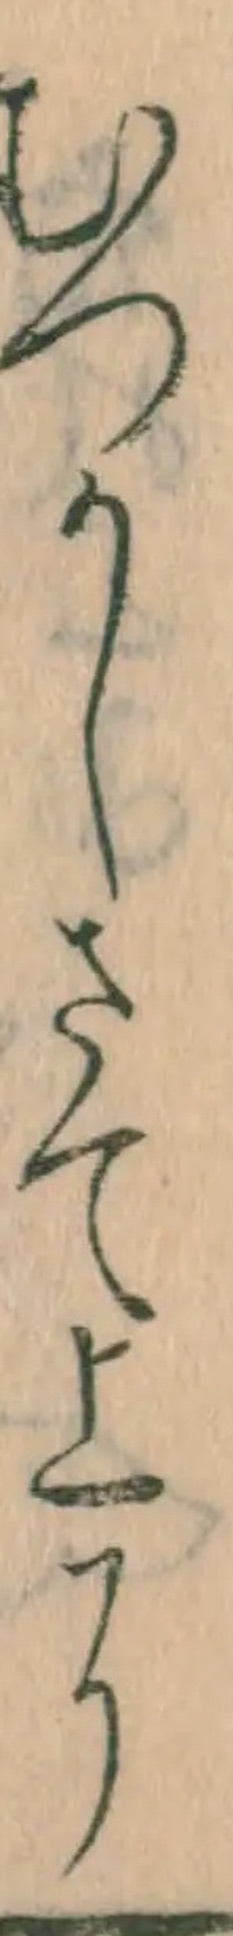むつかしさて上に
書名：錦繍枕 5巻. [5]
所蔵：国立国会図書館 National Diet Library, JAPAN
